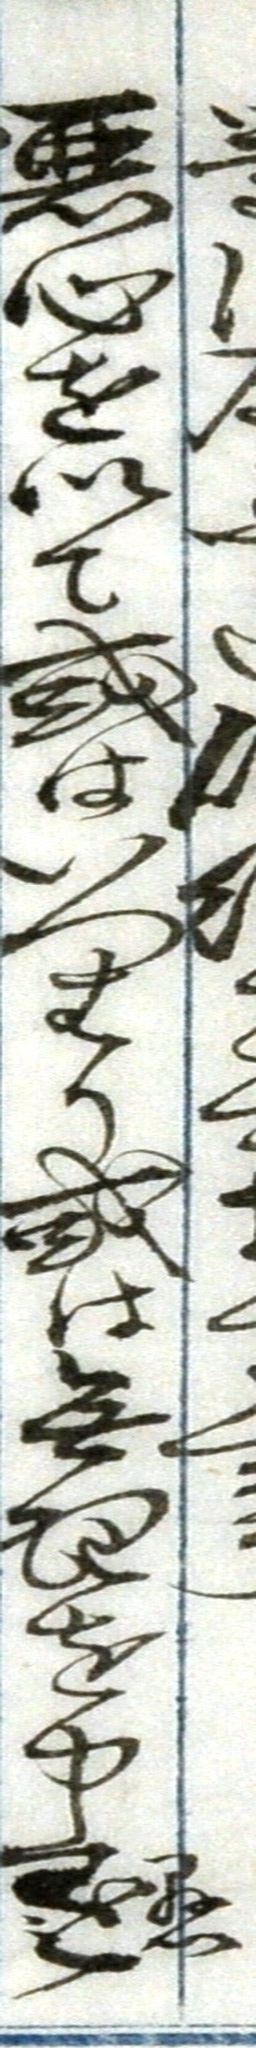一悪心を以て或はいつはり或は無理を申懸
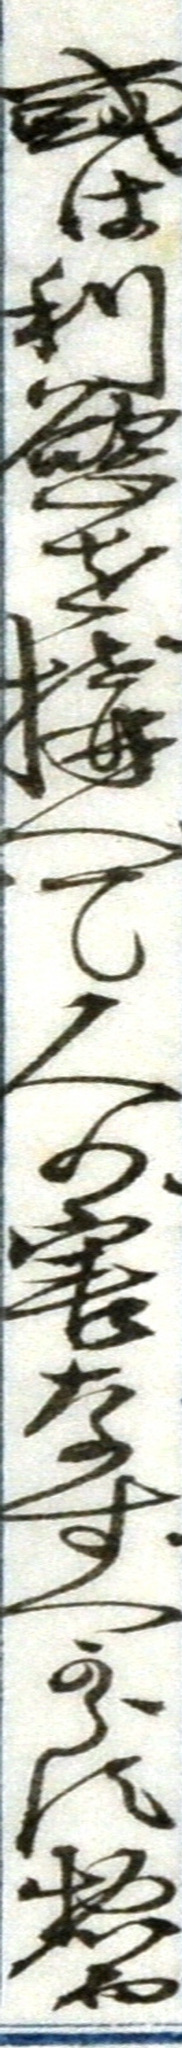或は利慾を構へて人の害なすへからす惣而
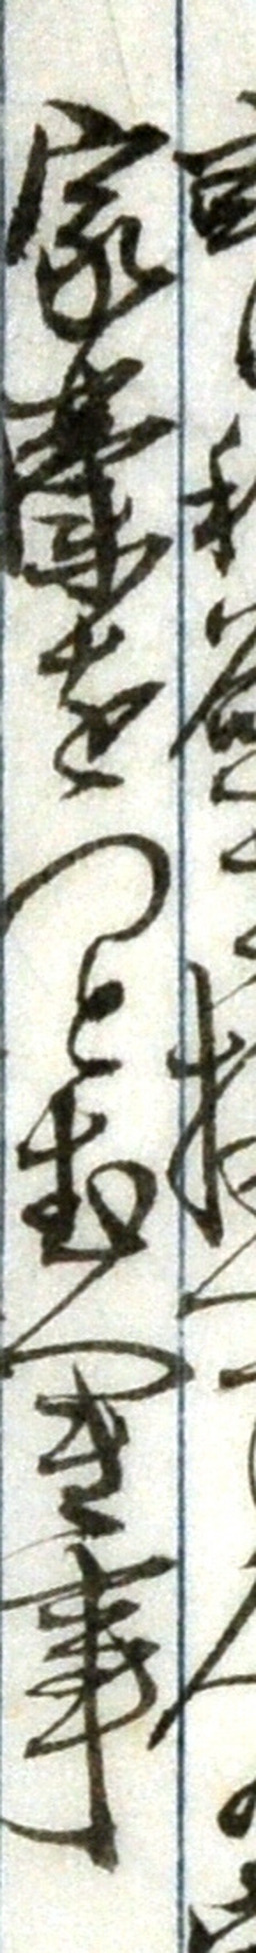家業をつとむへき事
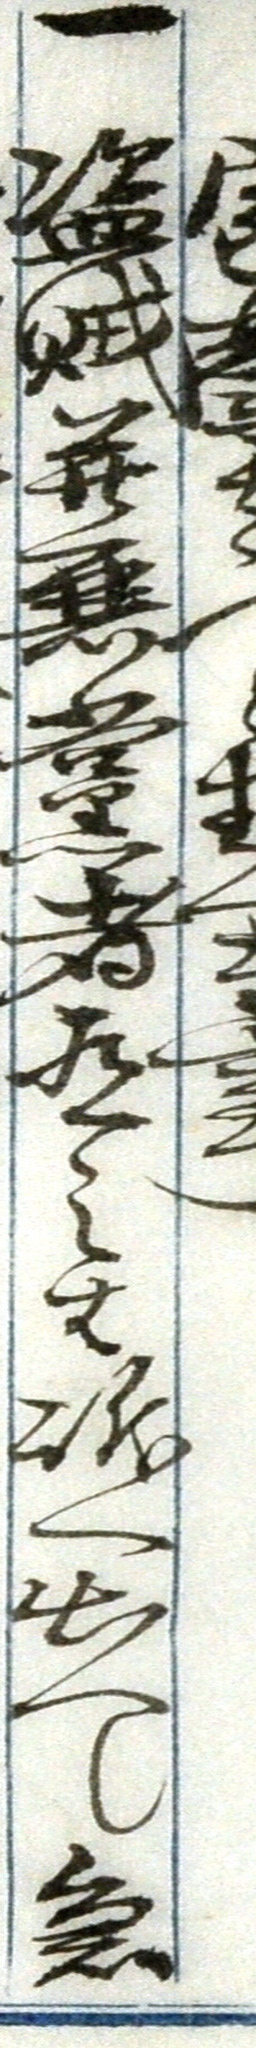一盗賊并悪党者有之は訴へ出へし急
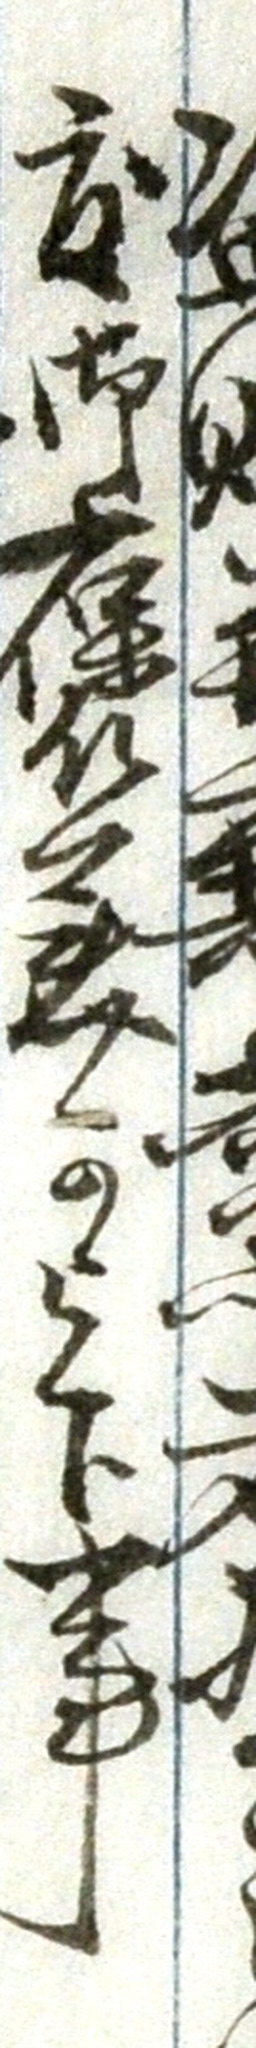度御褒美可被下事
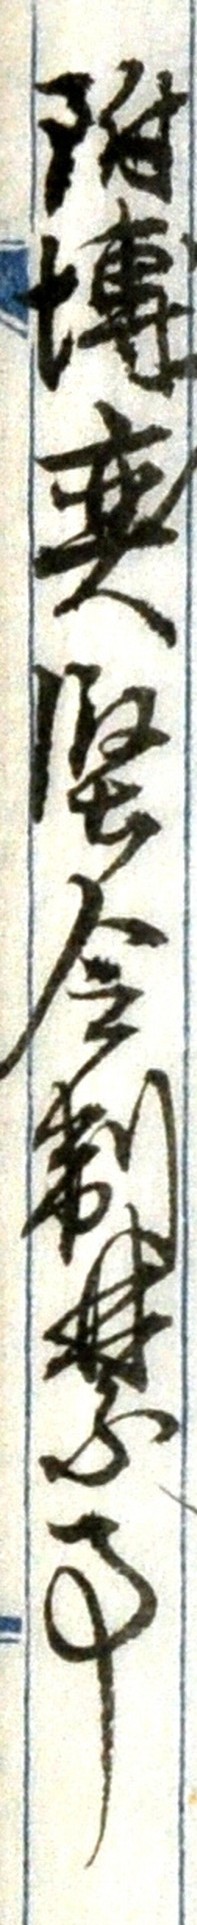附博奕堅令制禁事

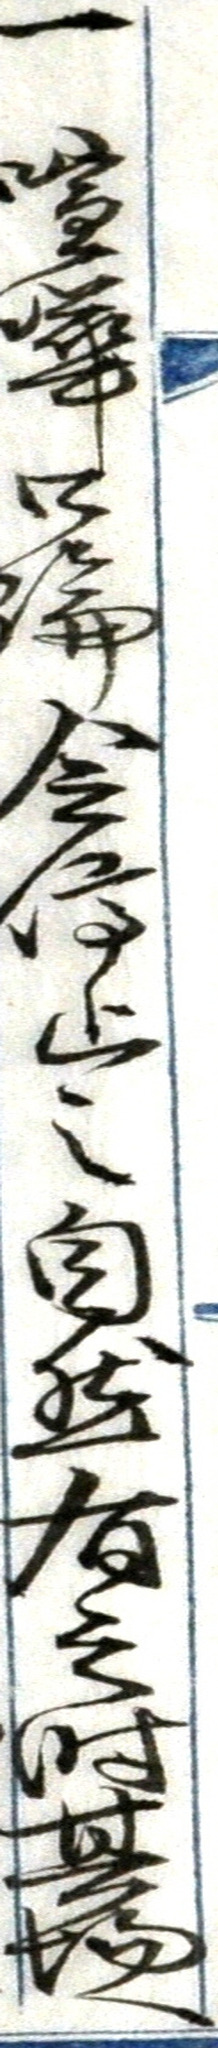一喧嘩口論令停止之自然有之時其場へ
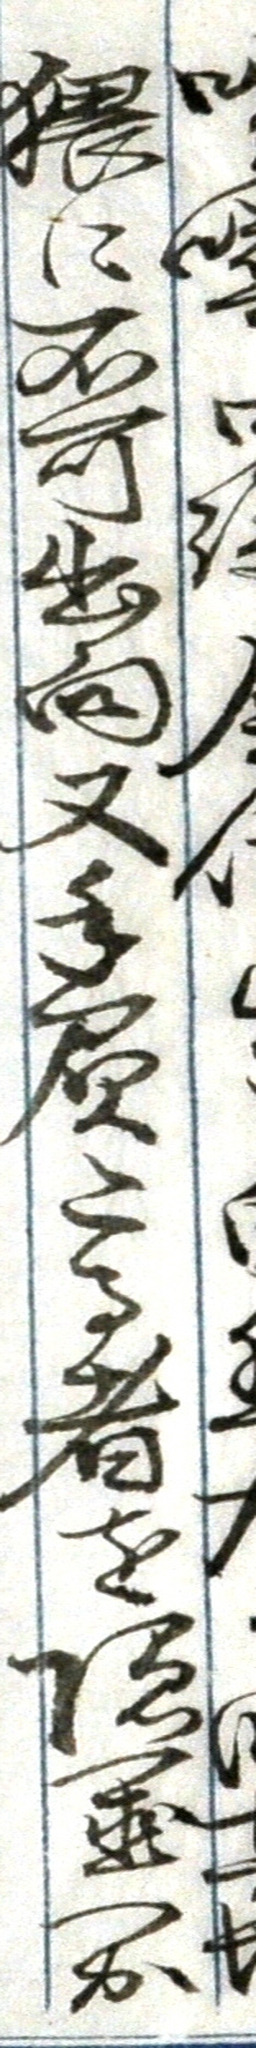猥に不可出向又手負たる者を隠置へか
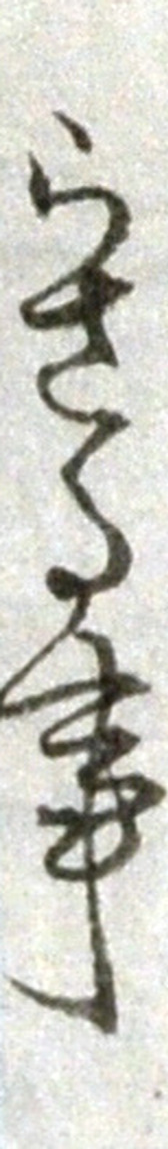らさる事
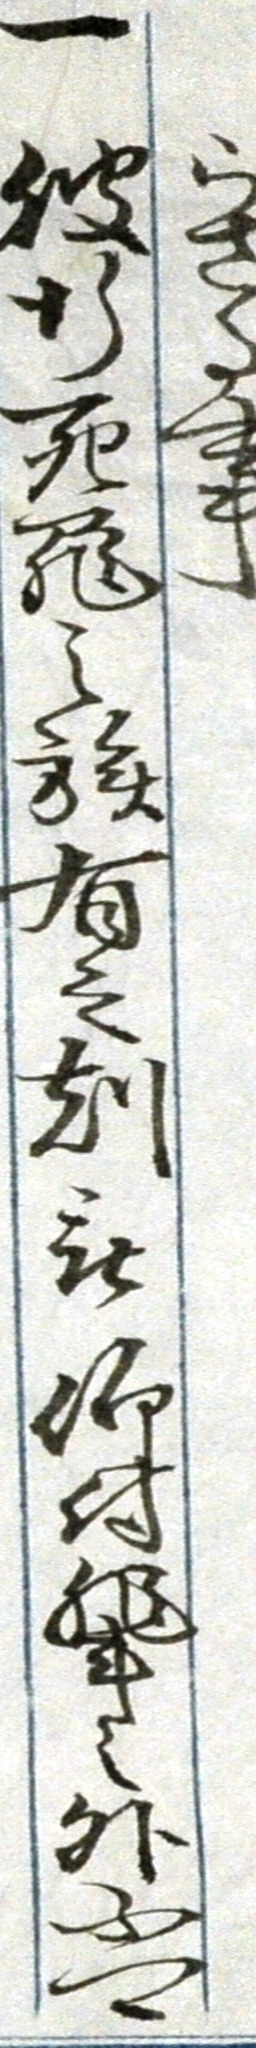一被行死罪之族有之刻被仰付輩之外不可
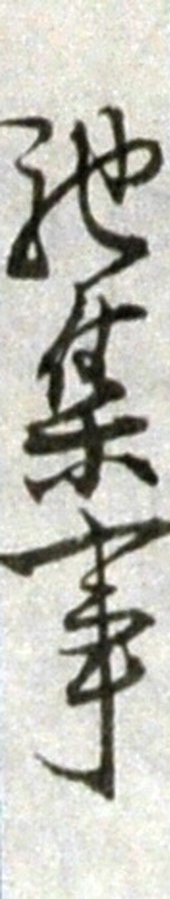弛集事
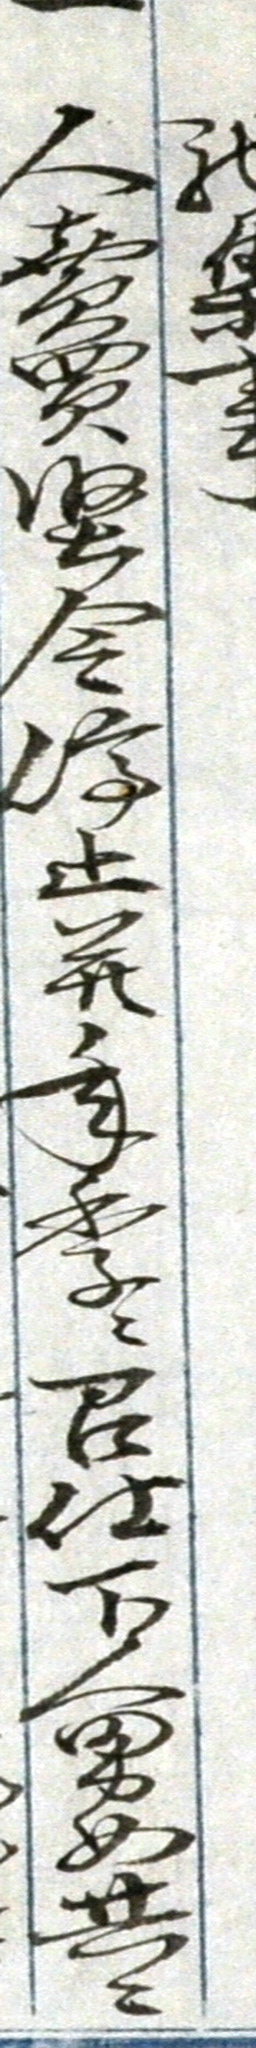一人売買堅令停止并年季に召仕下人男女共に
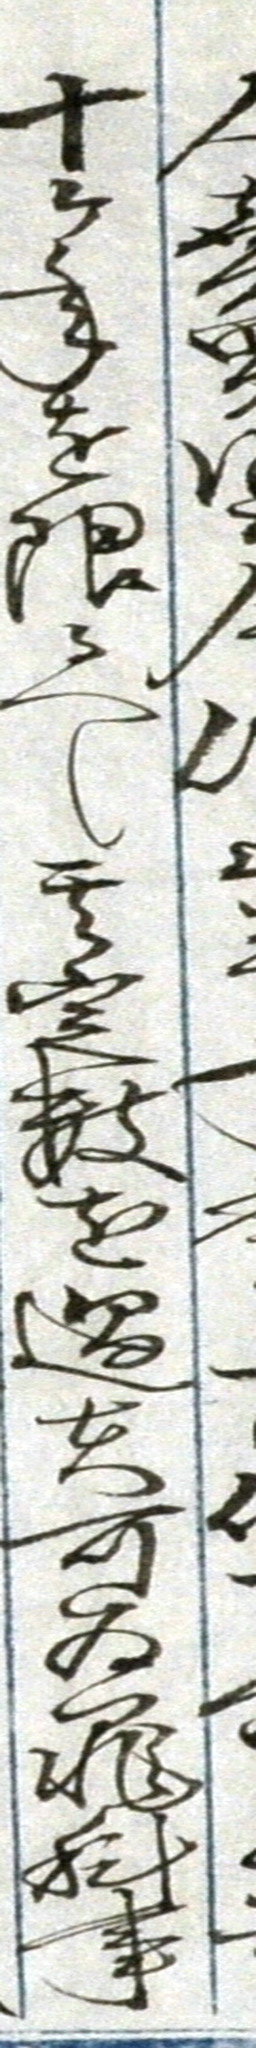十ヶ年を限るへし其定数を過は可為罪科事
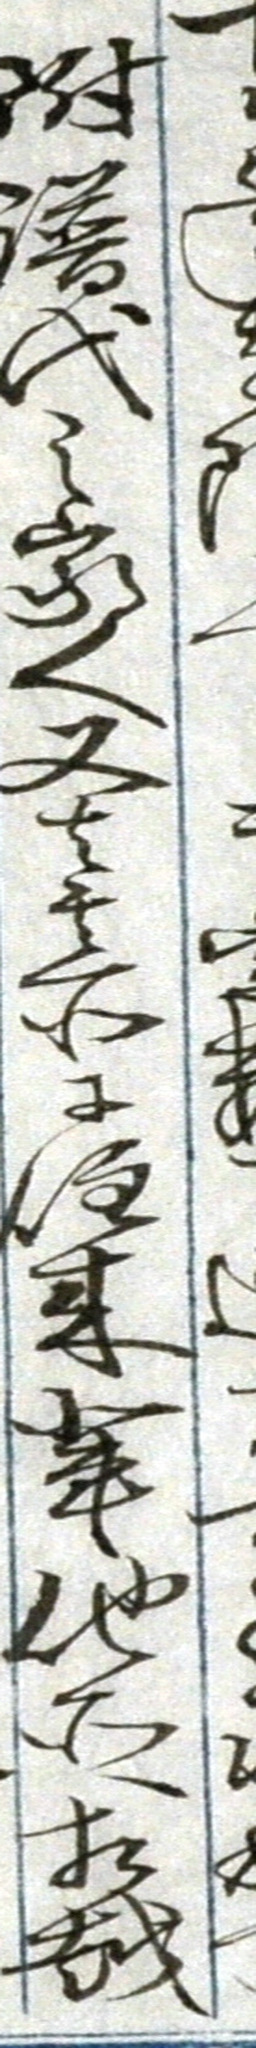附譜代之家人又は其所に住来輩他所へ相越
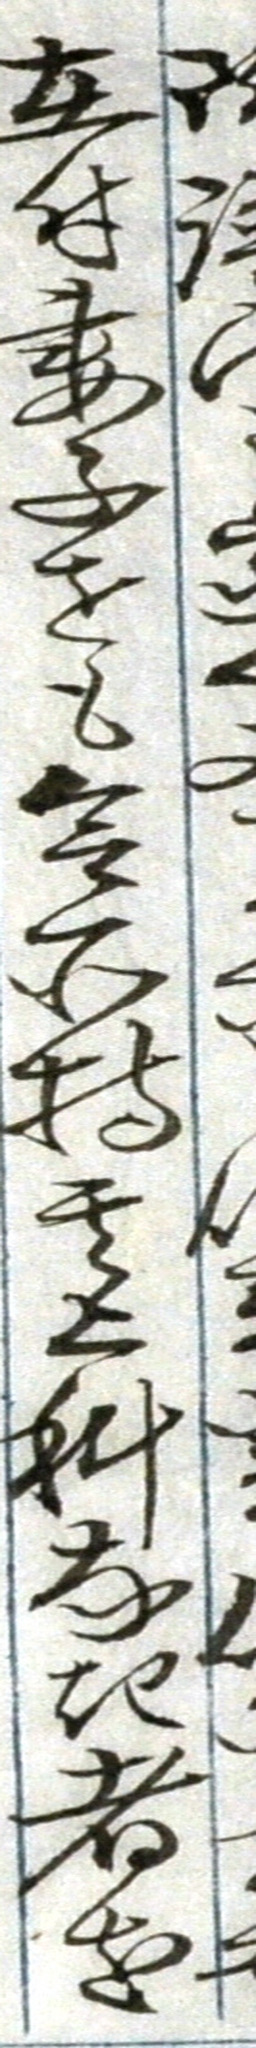在付妻子をも令所持其上科なき者を
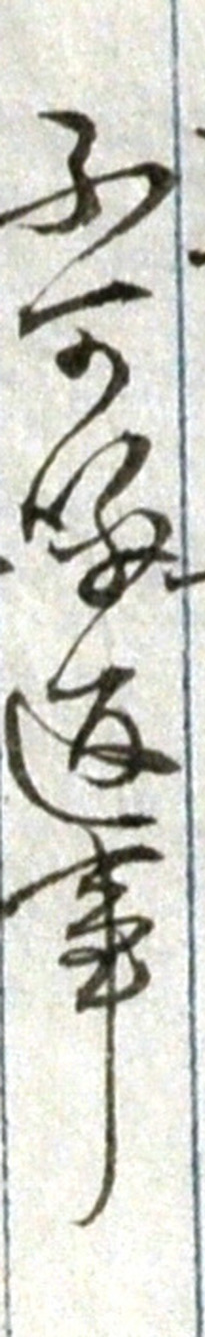不可呼返事
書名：御高札之写
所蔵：伊那市立高遠町図書館・合同会社AMANE
